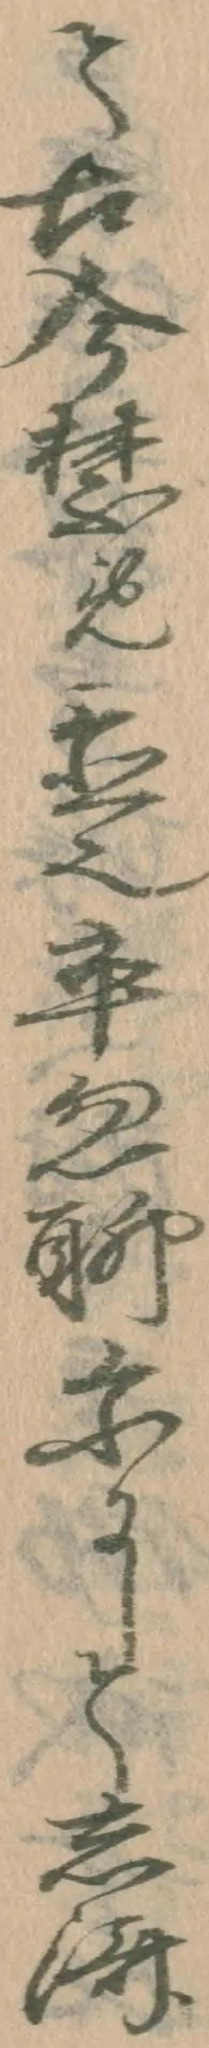て古今禁免置也卒忽聊爾尓して志済
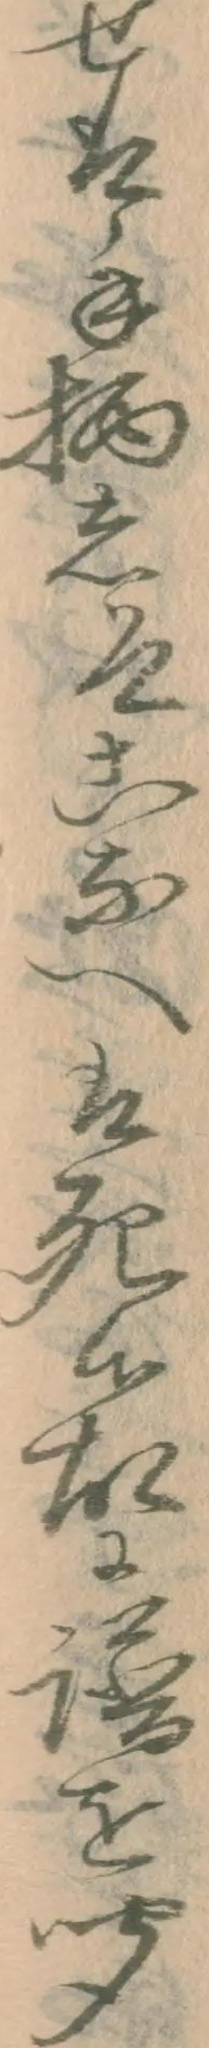せ盤手柄志そ古なへ盤死候故尓譜を聞
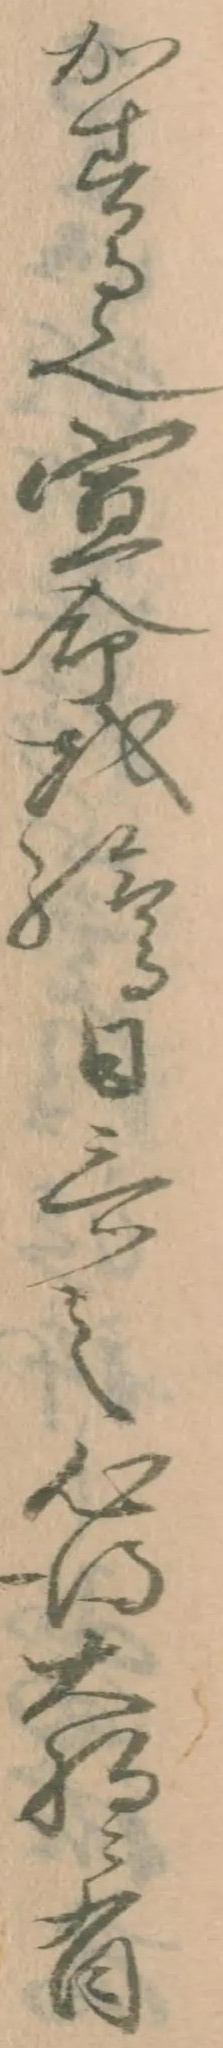か春る也宣命越給る日三つ之心得大将に有
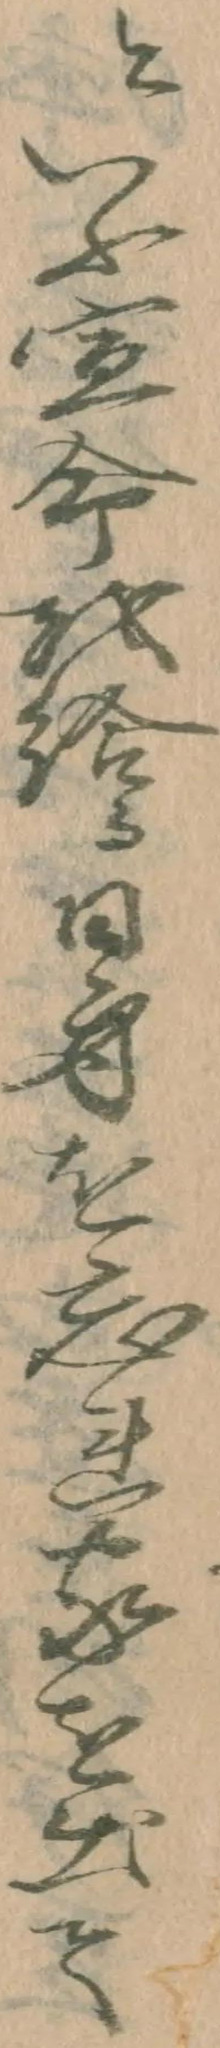といふ宣命越給る日身を忘連家を出て
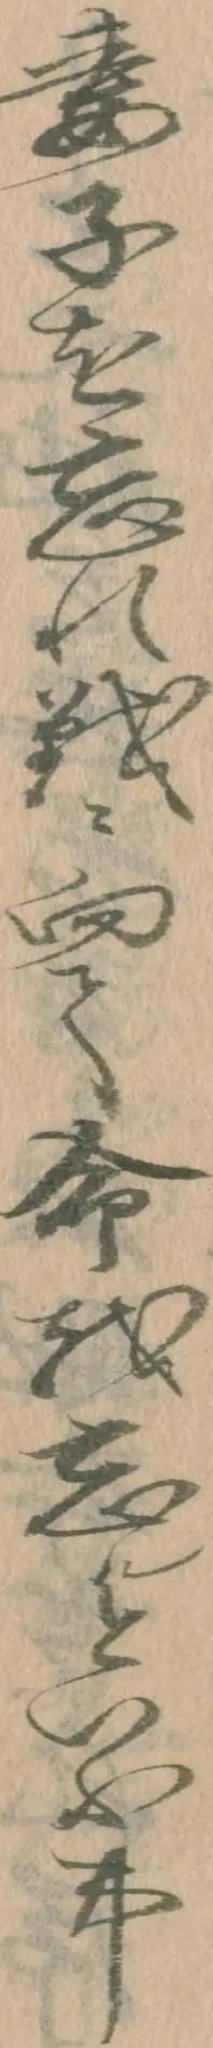妻子を忘れ戦に向て命越忘るといふ事
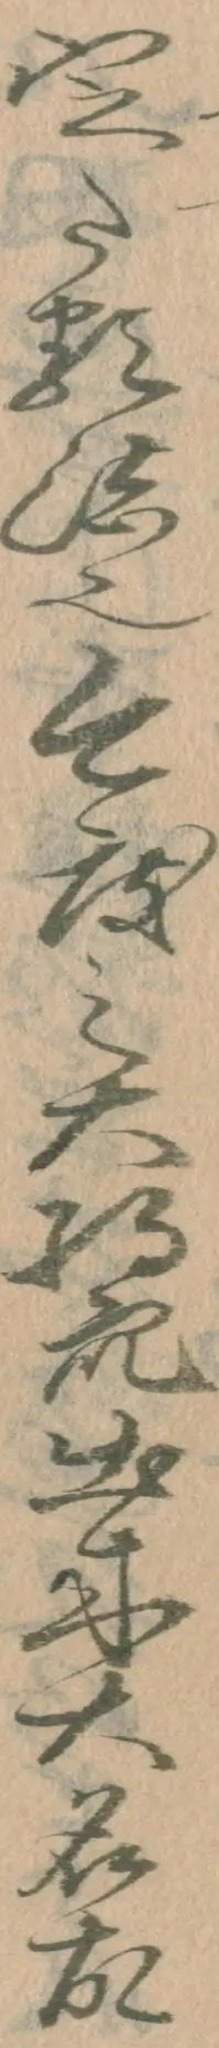定た類法也今度之大将衆出来大名故
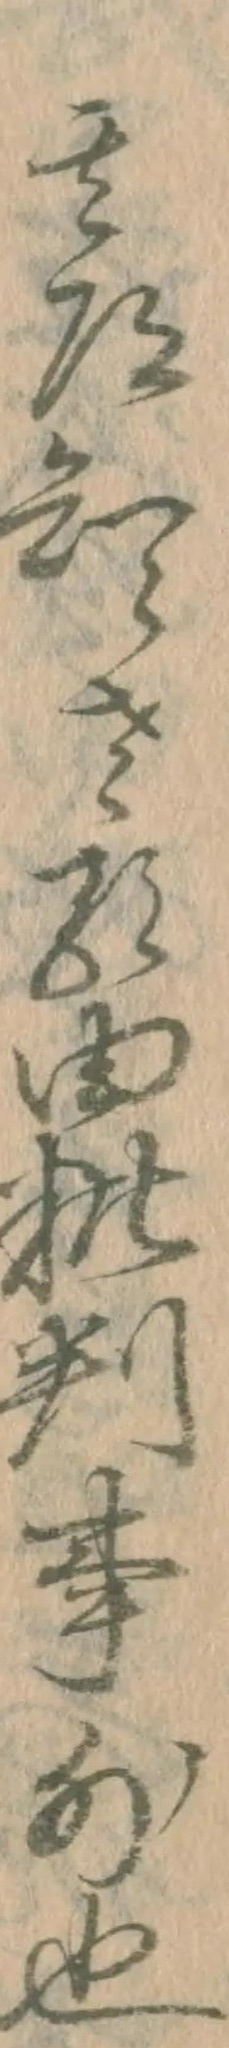其道知らさ類由批判事外也
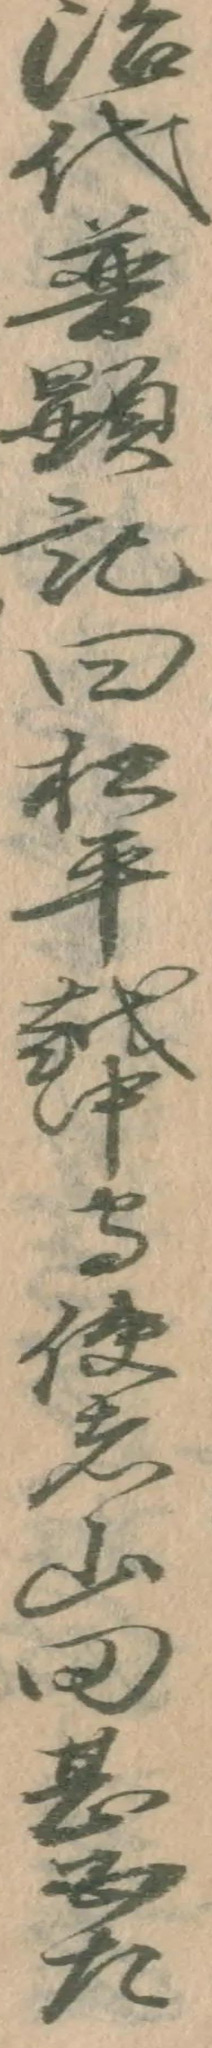治代普顕記曰松平越中守使者山田甚五左
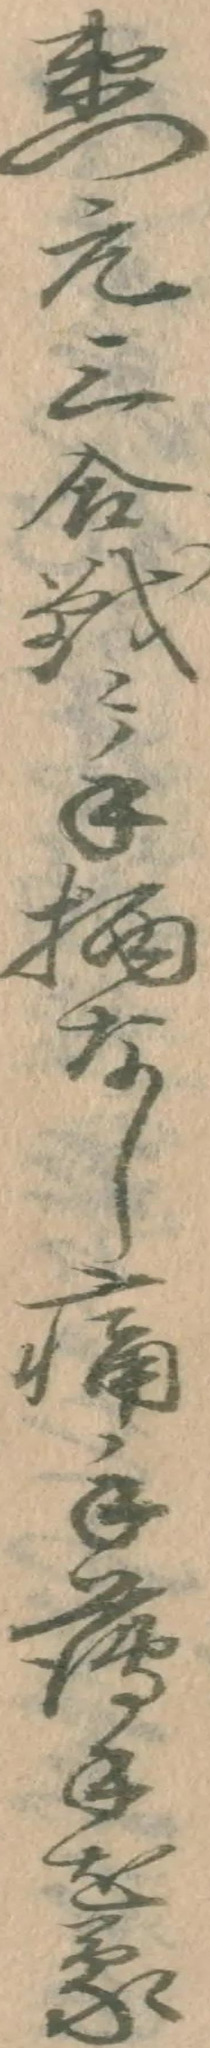衛門元三合戦に手柄なし痛手落手を蒙
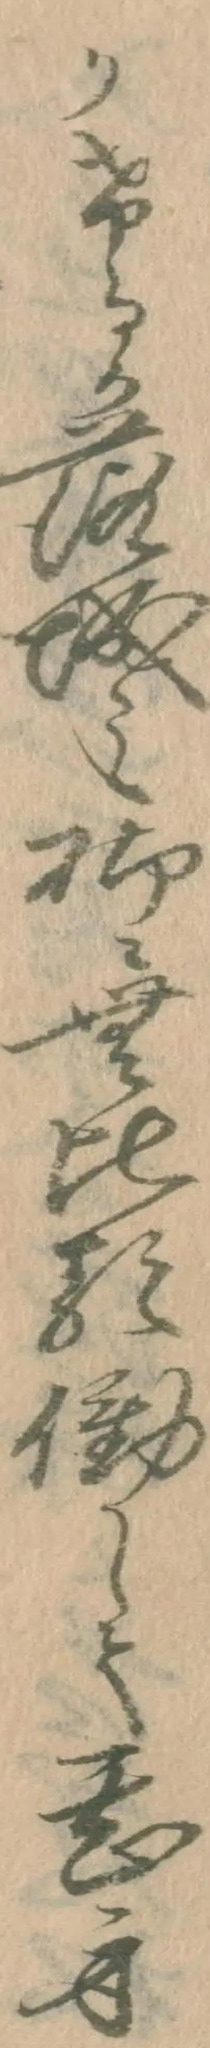り希るか落城之砌に無比類働して甚身
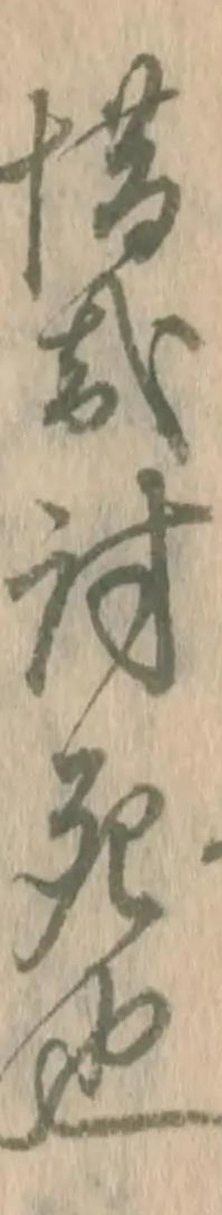惜哉討死也
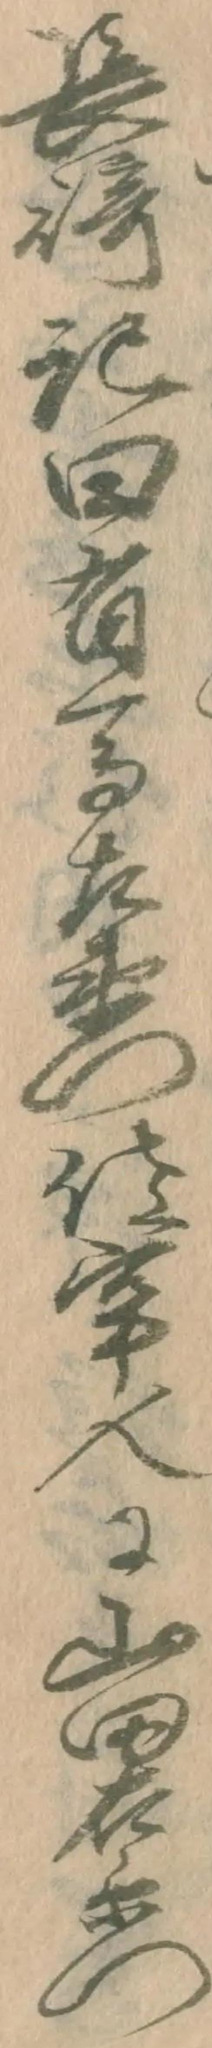長崎記曰有馬左衛門佐牢人尓山田左衛門

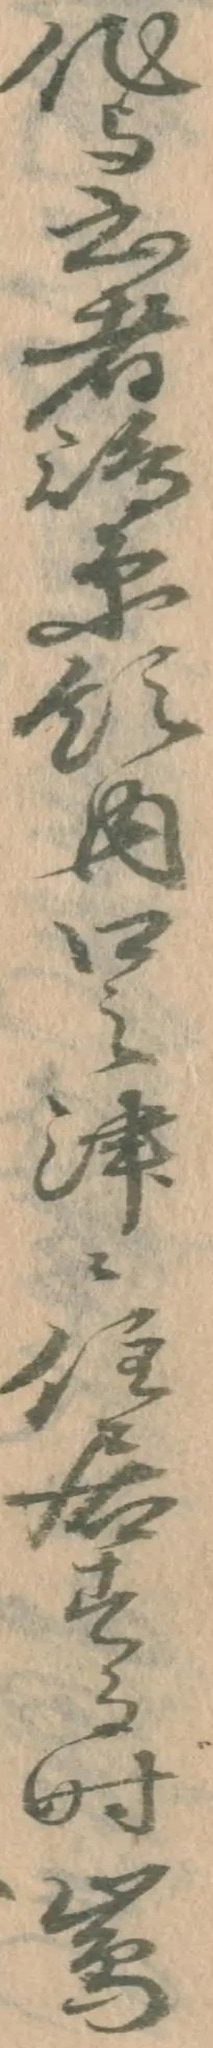作与云者島原領内口之津に住居春る時島
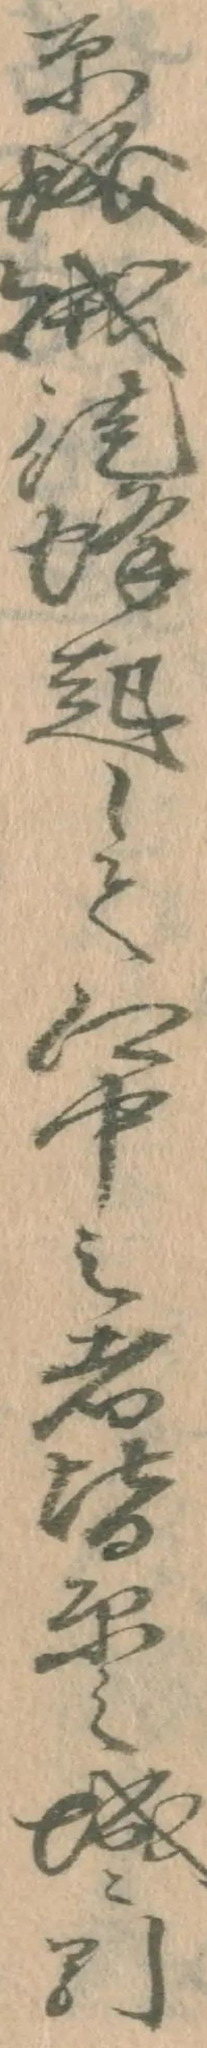原城賊徒蜂起して郷中之者皆原之城引
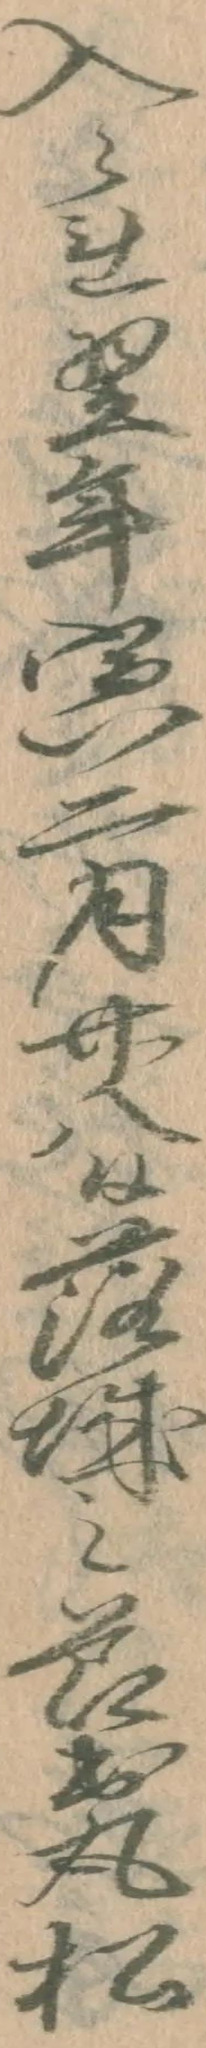入ら連翌年寅二月廿八日落城之節出丸松
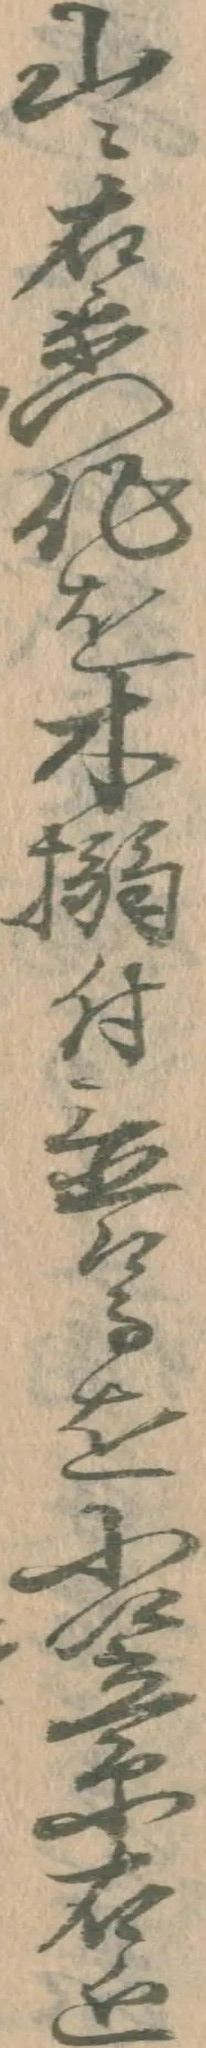山に右衛門作を木搦付置けるを小笠原右近
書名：切支丹御退治記 49巻. [8]
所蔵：国立国会図書館 National Diet Library, JAPAN
